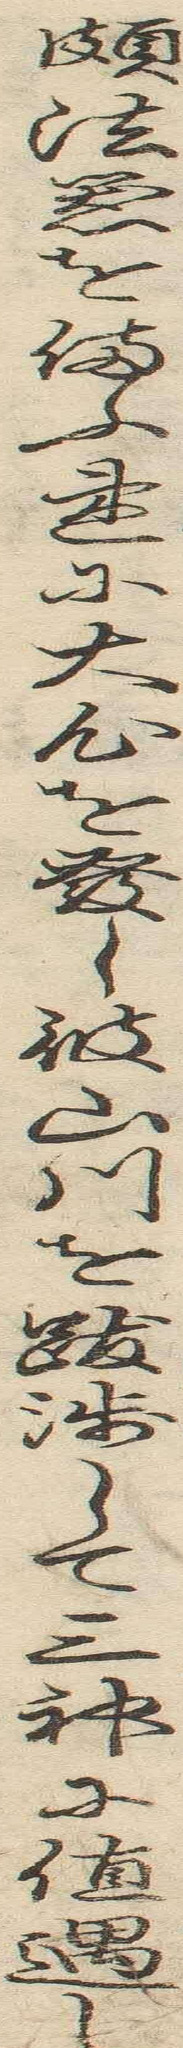頗法器を備ふ速に大心を發し彼山川を跋渉して三神に値遇し

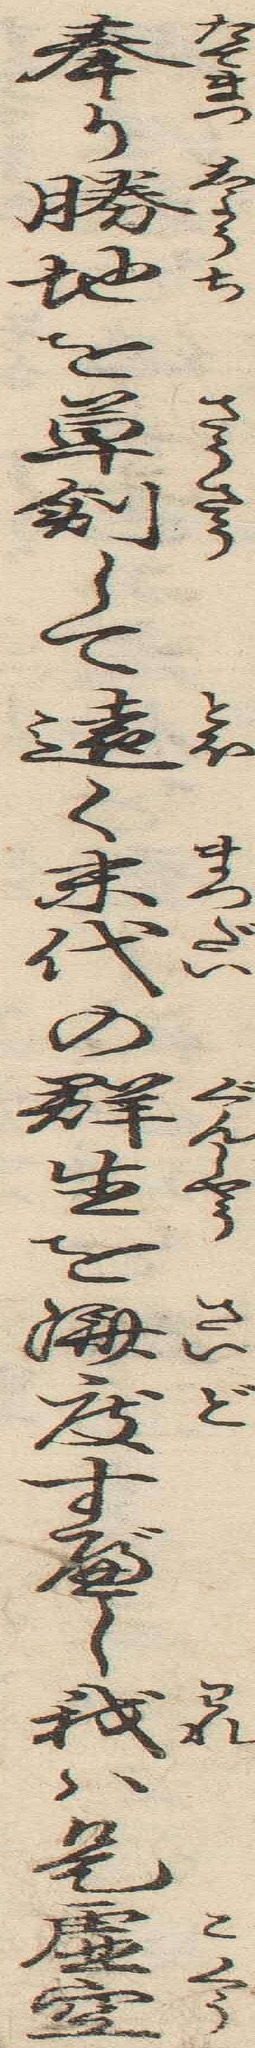奉り勝地を草創して遠く末代の群生を濟度すべし我は是虚空
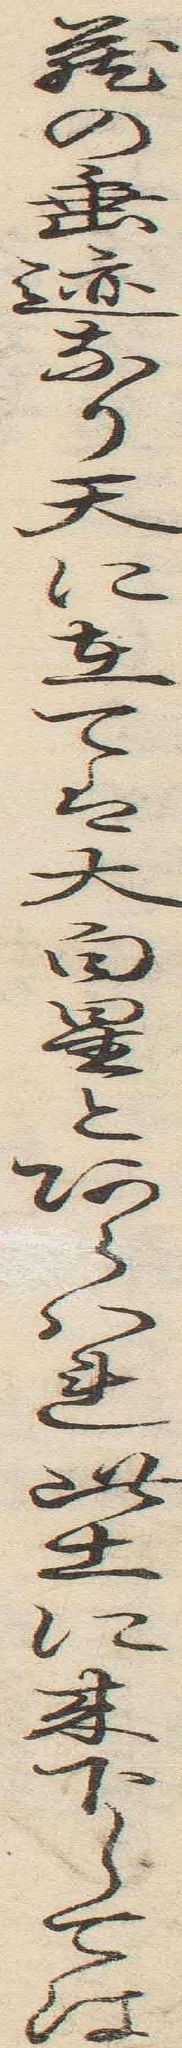蔵の垂迹なり天に在ては大白星とあらはれ此土に来下しては
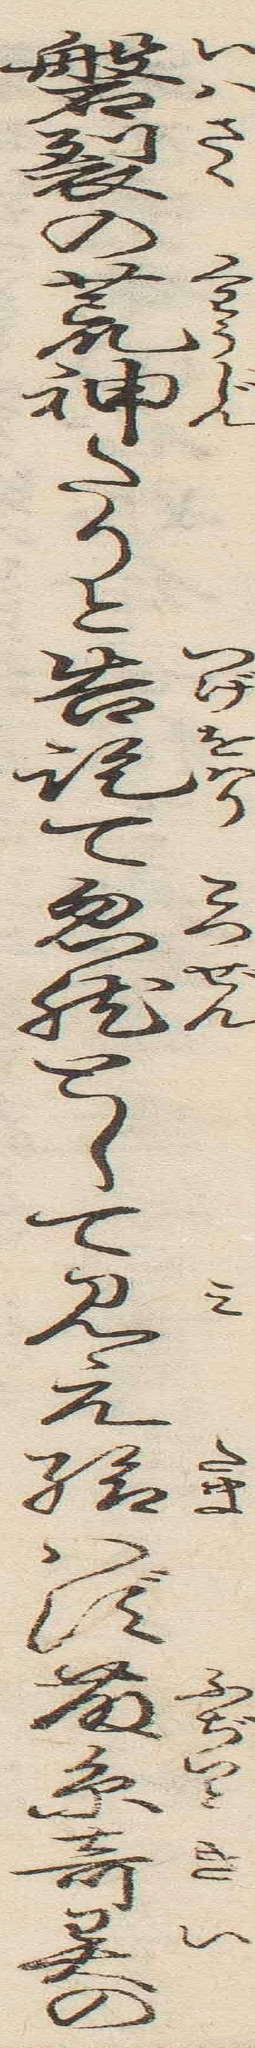磐裂の荒神たりと告説て忽然として見え給はず藤糸奇異の
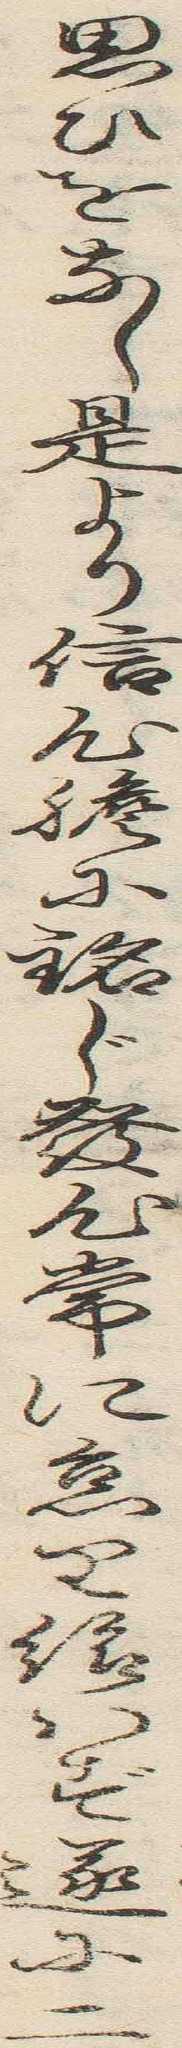思ひをなし是より信心膽に銘じ発心常に怠り給はず遂に二
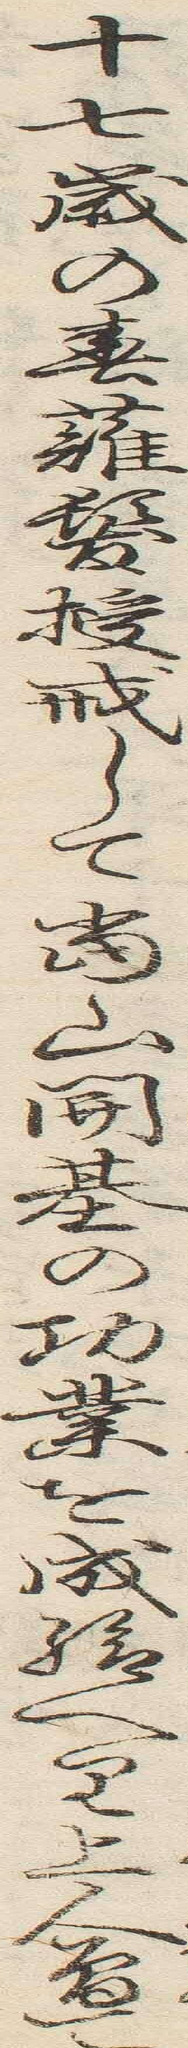十七歳の春薙髪授戒して當山開基の功業を成給へり上人曽て
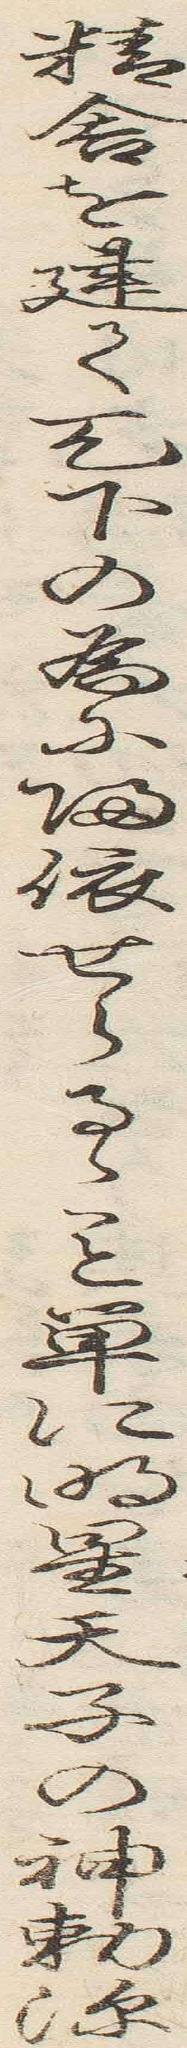精舎を建て天下の為に帰依せらるゝこと単に明星天子の神勅深
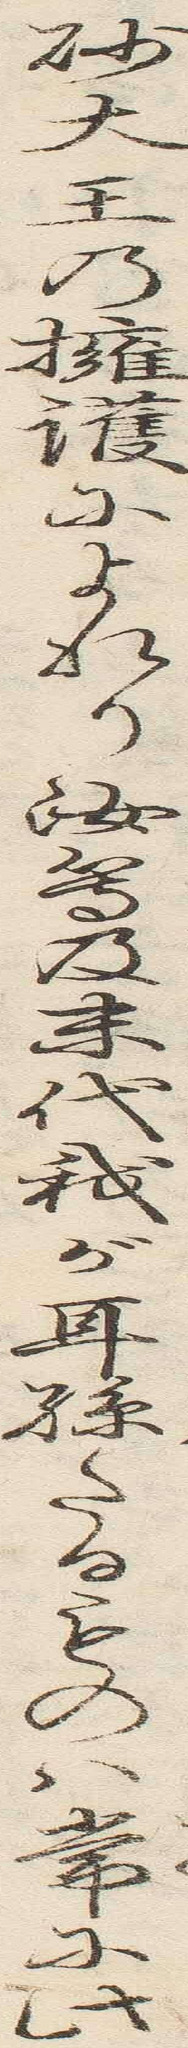砂大王の擁護によれり汝等及末代我が耳孫たるものは常に此
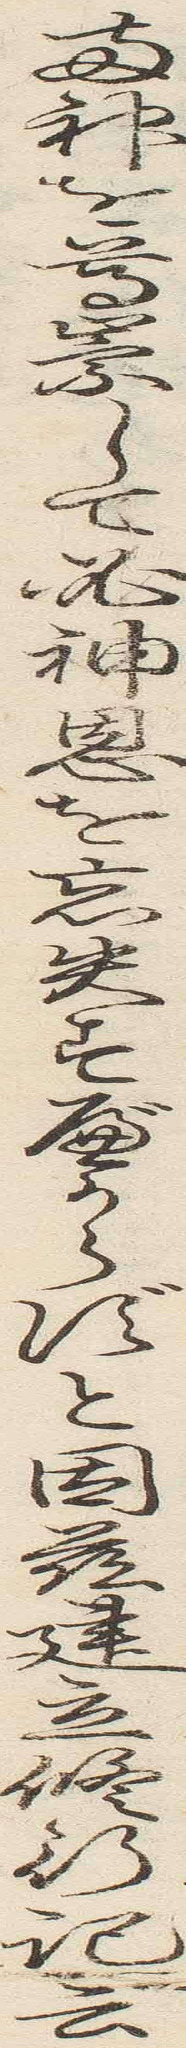両神を尊崇して必神恩を忘失すべからずと因茲建立修行記云
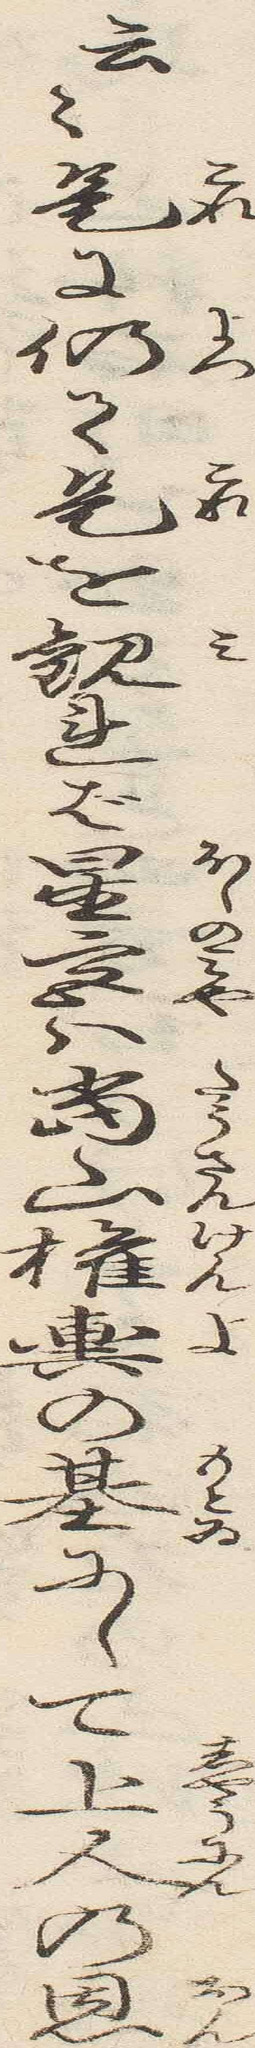云〻是に仍て是を観れば星宮は當山権輿の基にして上人の恩
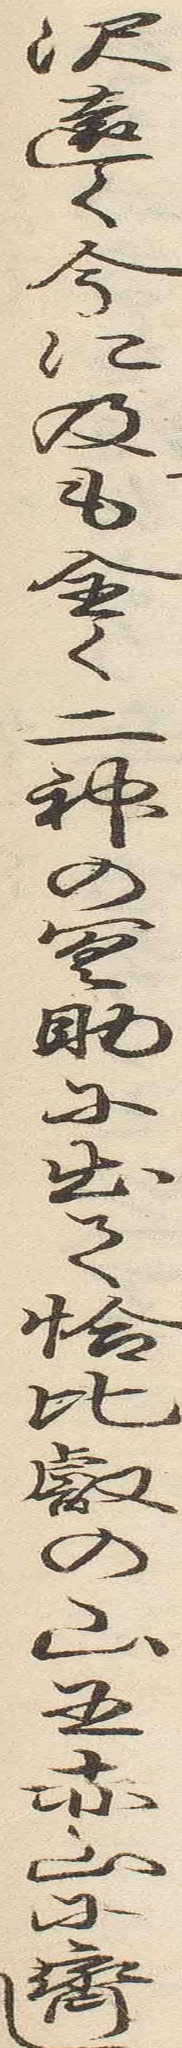沢遠く今に及も全く二神の冥助に出て恰比叡の山王赤山に齊し
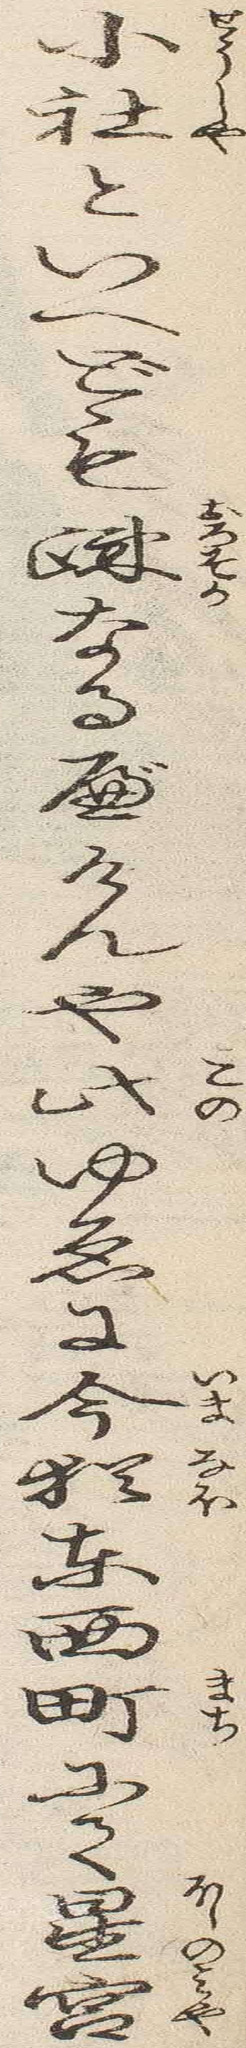小社といへども疎なるべけんや此ゆゑに今猶東西町にて星宮
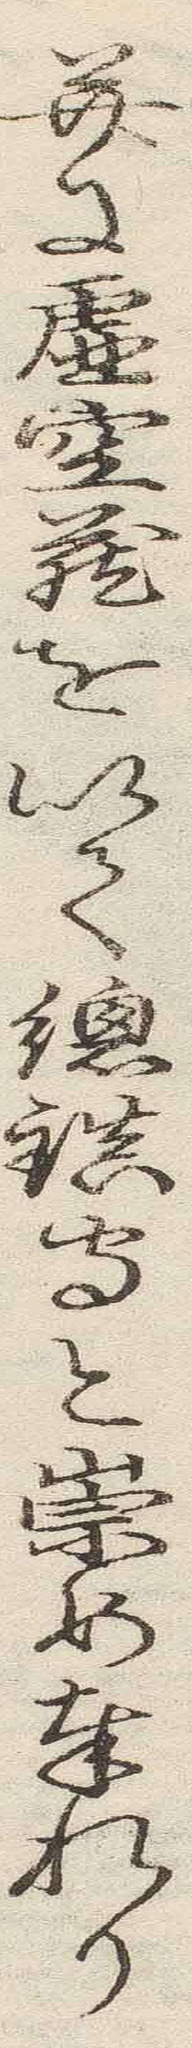并に虚空蔵を以て總鎮守と崇め奉れり
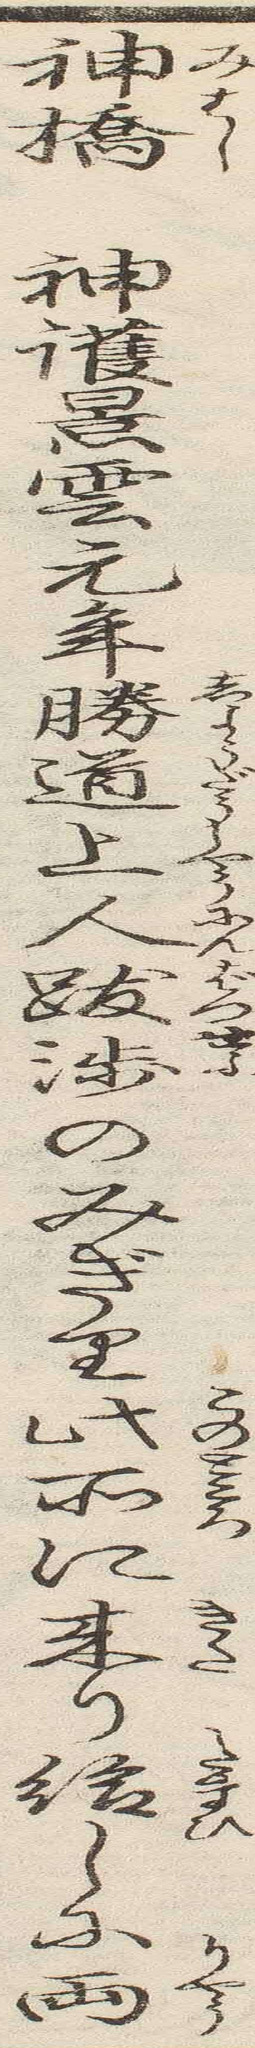神橋神護景雲元年勝道上人跋渉のみぎり此所に来り給しに両
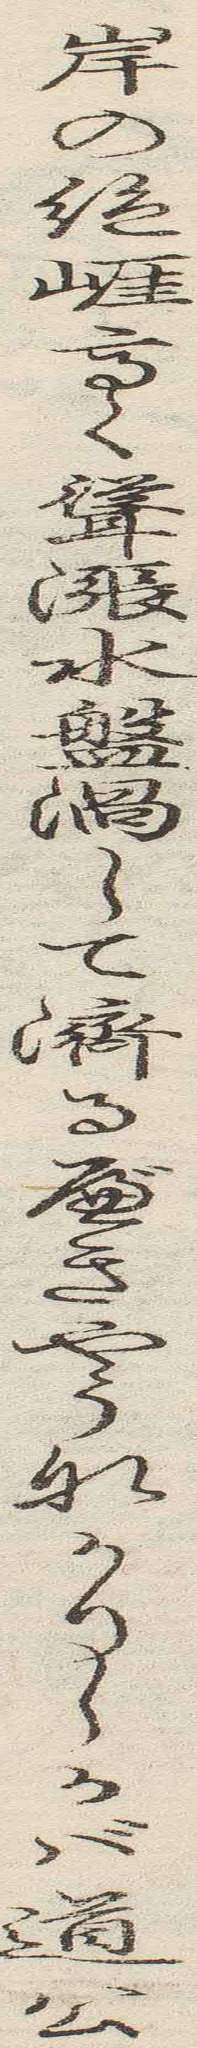岸の絶崕高く聳漲水盤渦して濟るべきやうなかりしかば道公
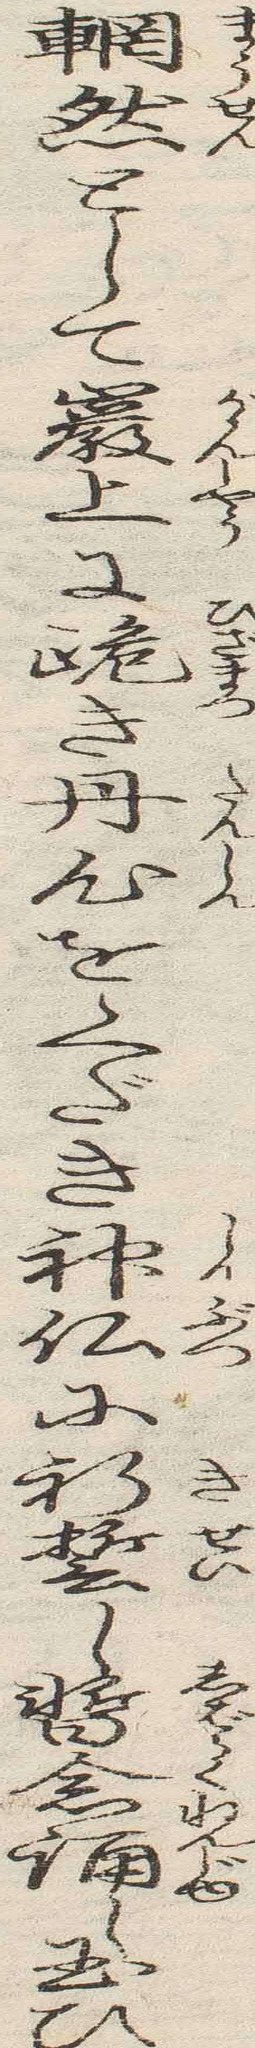輞然として巌上に跪き丹心をくだき神仏に祈誓し暫念誦し玉ひ
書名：日光山志
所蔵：東京学芸大学附属図書館 国文学研究資料館
